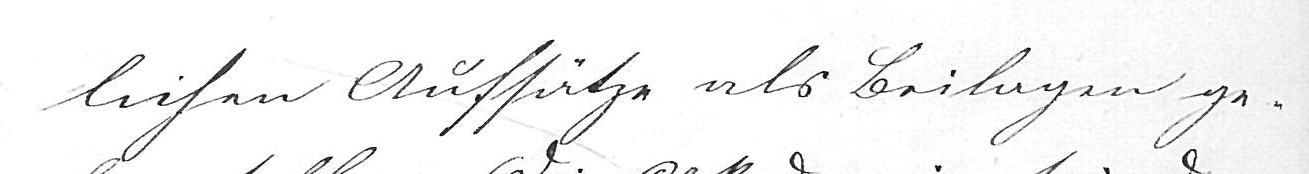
lichen Aufsätze als Beilagen ge-
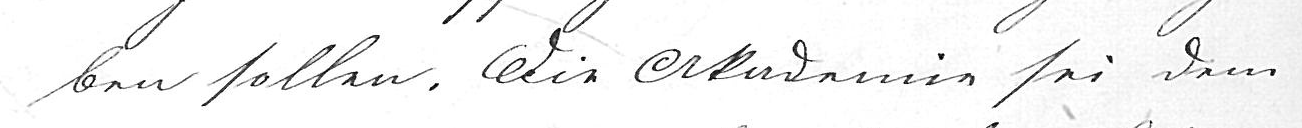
ben sollen. Die Akademie seit dem
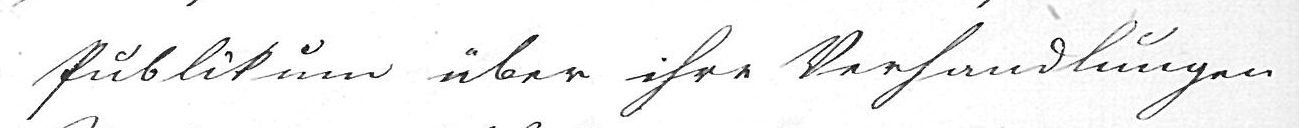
Publikum über ihre Verhandlungen
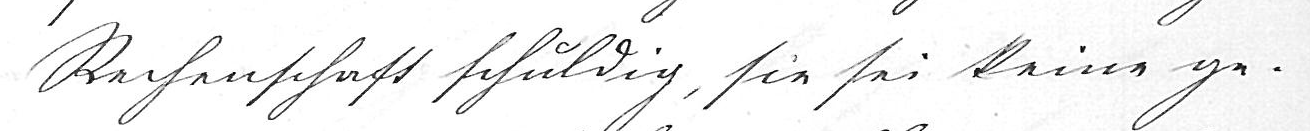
Rechenschaft schuldig, sie sein keine ge-
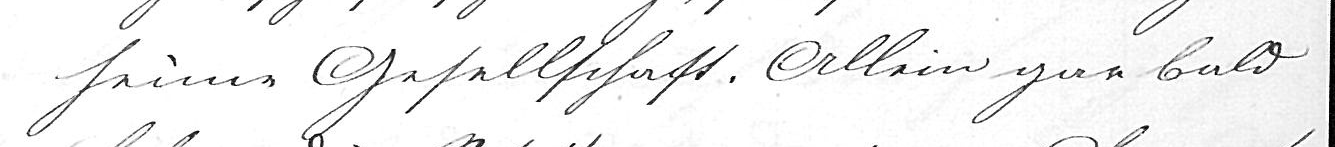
heime Gesellschaft. Allein gar bald
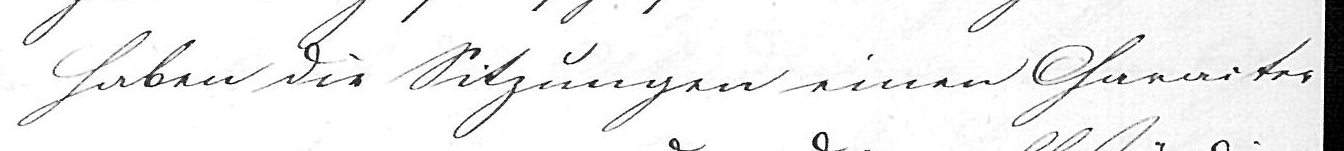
haben die Sitzungen einen Character-
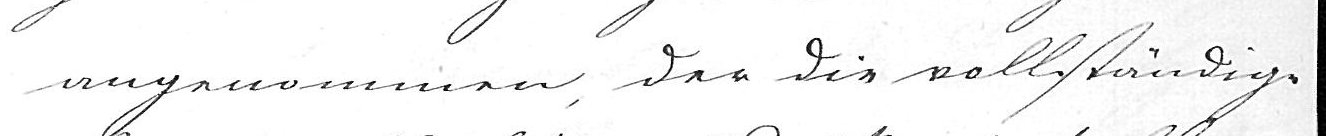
angenommen, der die vollständige
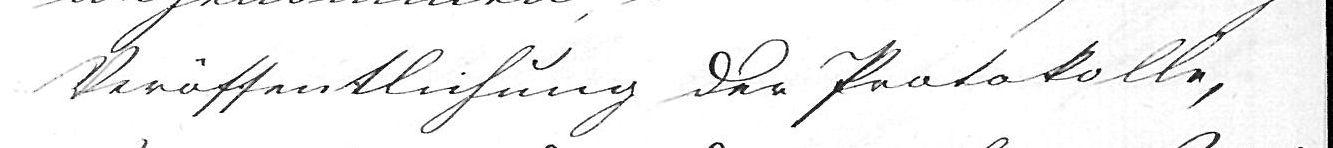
Veröffentlichung die Protokolle,
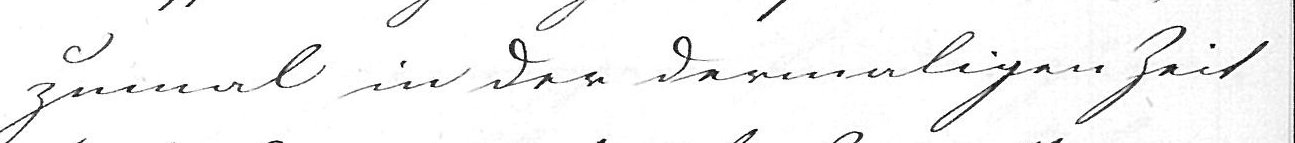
zumal in der dermalige Zeit
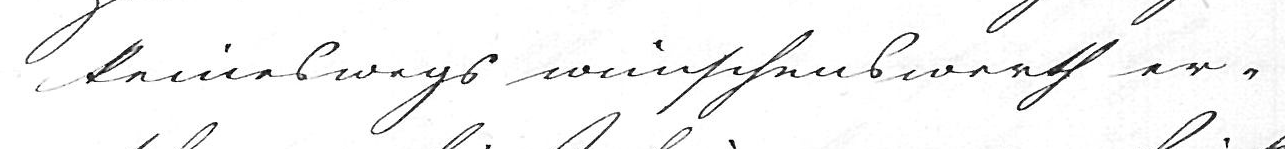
keineswegs wünschenwerth er-
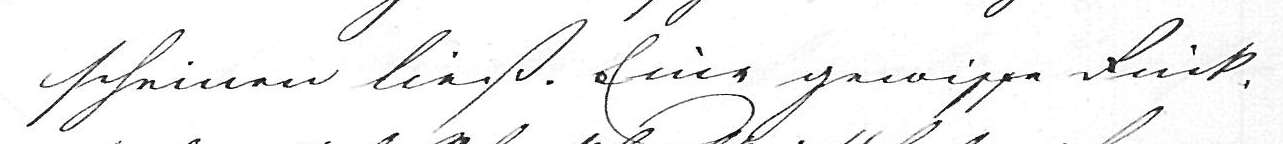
scheinen ließ. Eine gewisse Rück-
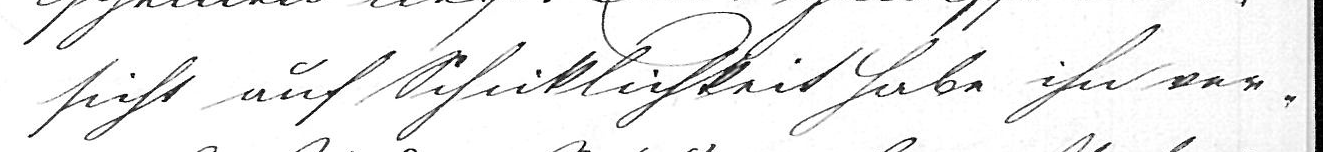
sicht auf Schicklichkeit habe ihn ver-
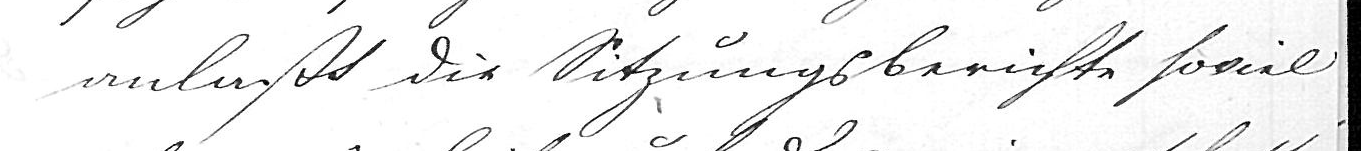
anlaßt die Sitzungsberichte soviel
